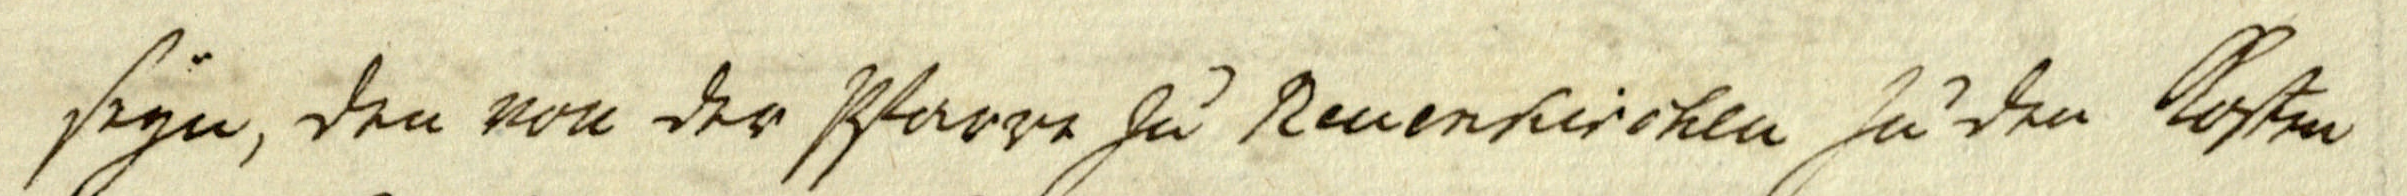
seÿn, den von der Pfarre zu Neuenkirchen zu den Kosten
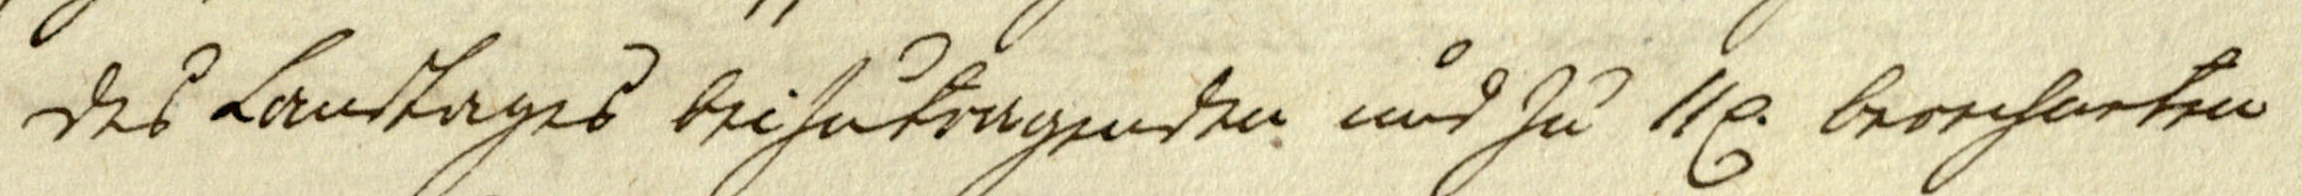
des Landtages beizutragenden und zu 11. s. berechneten
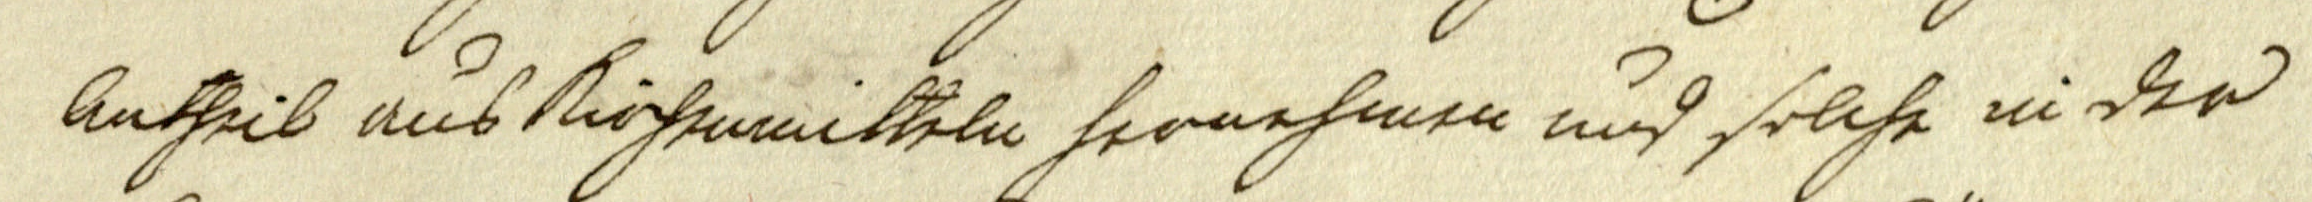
Antheil aus Kirchenmitteln hernehmen und solche in der
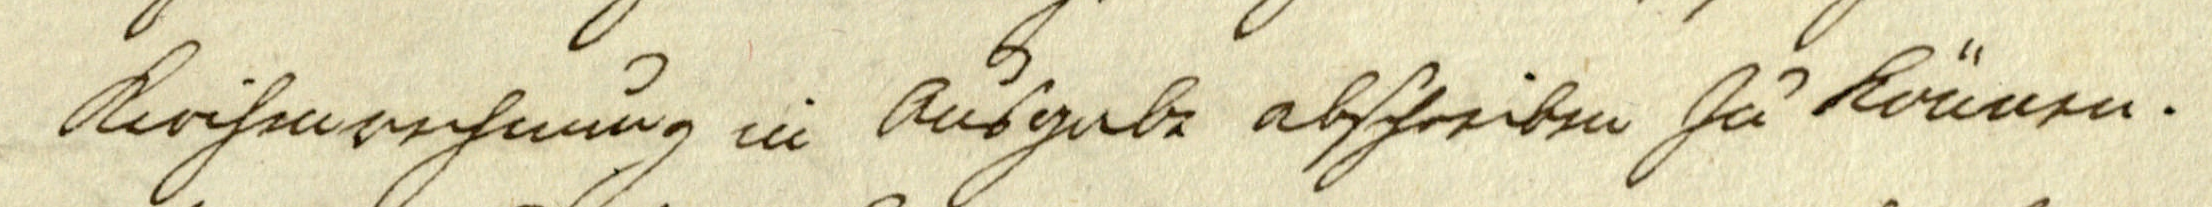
Kirchenrechnung in Ausgabe abschreiben zu können.
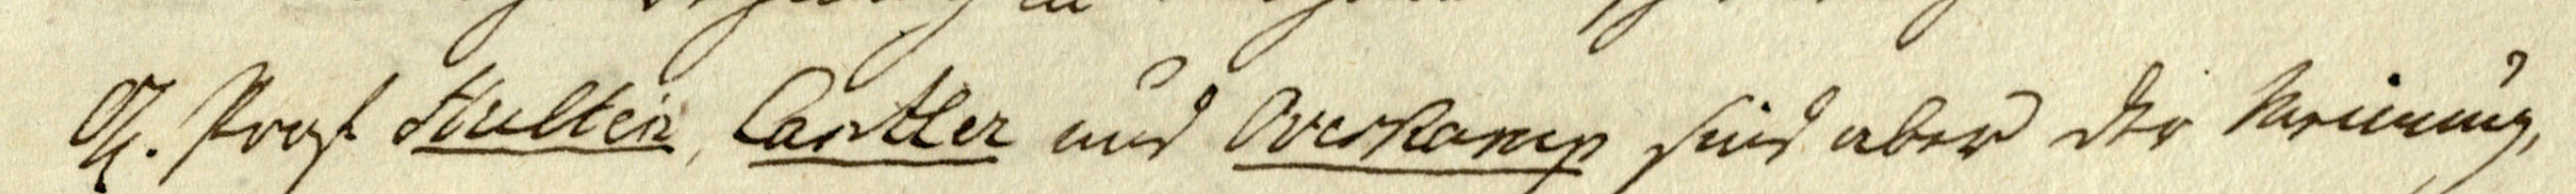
dh. Prof. Hultén, Canzler und Overkamp sind aber der Meinung,
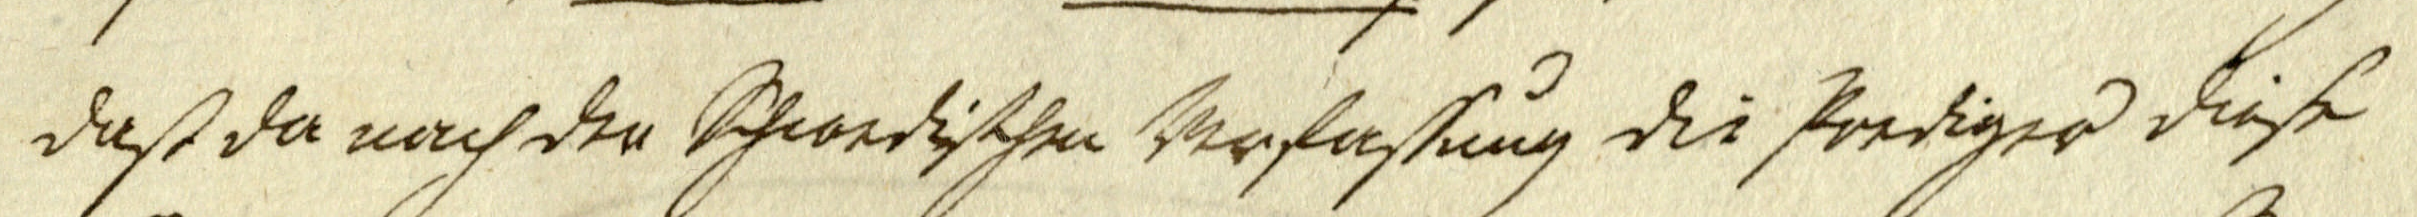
daß da nach der schwedischen Verfassung die Prediger diese
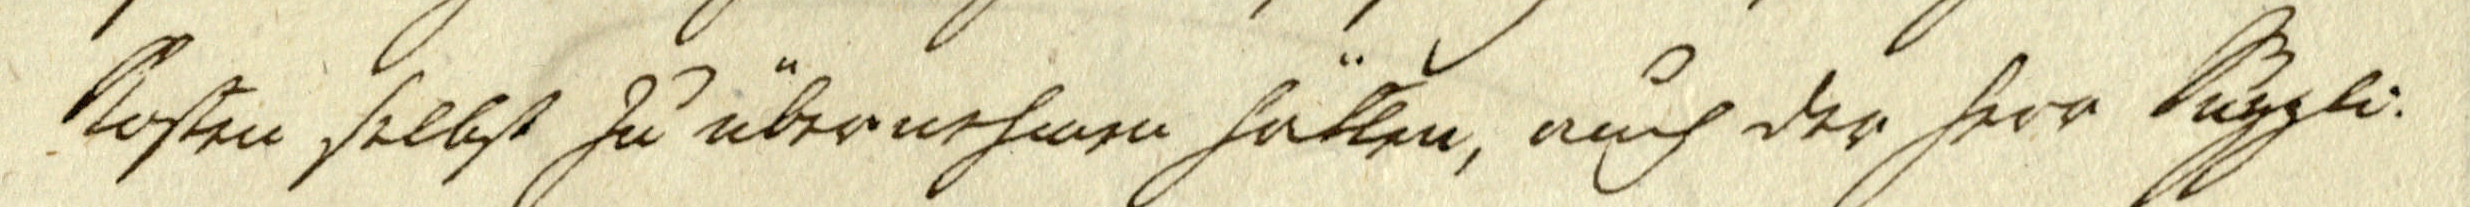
Kosten selbst zu übernehmen hätten, auch der herr Suppli¬
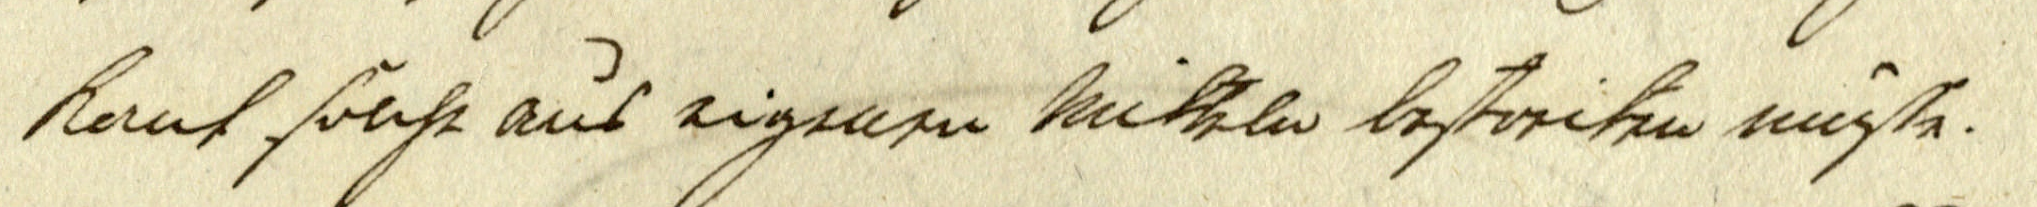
kant solche aus eigenen Mitteln bestreiten müsse.
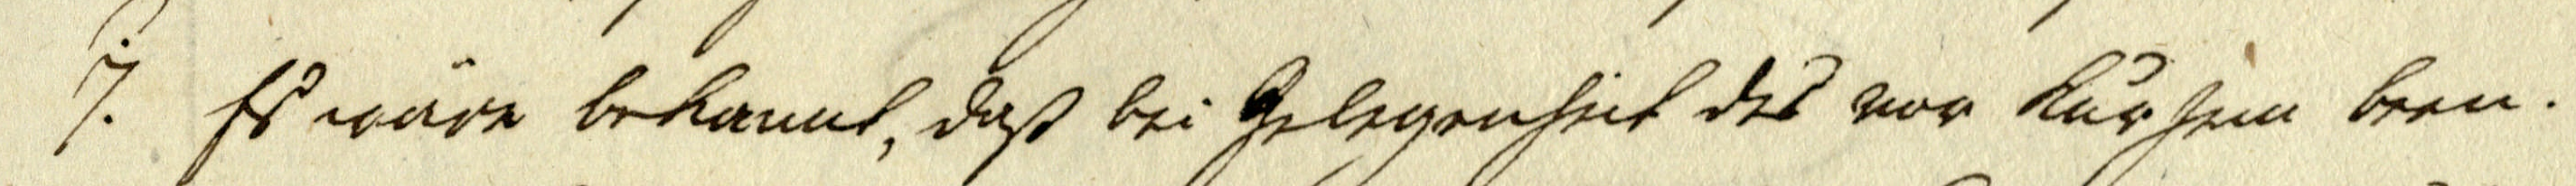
7. Es wäre bekannt, daß bei Gelegenheit des vor kurzem been¬
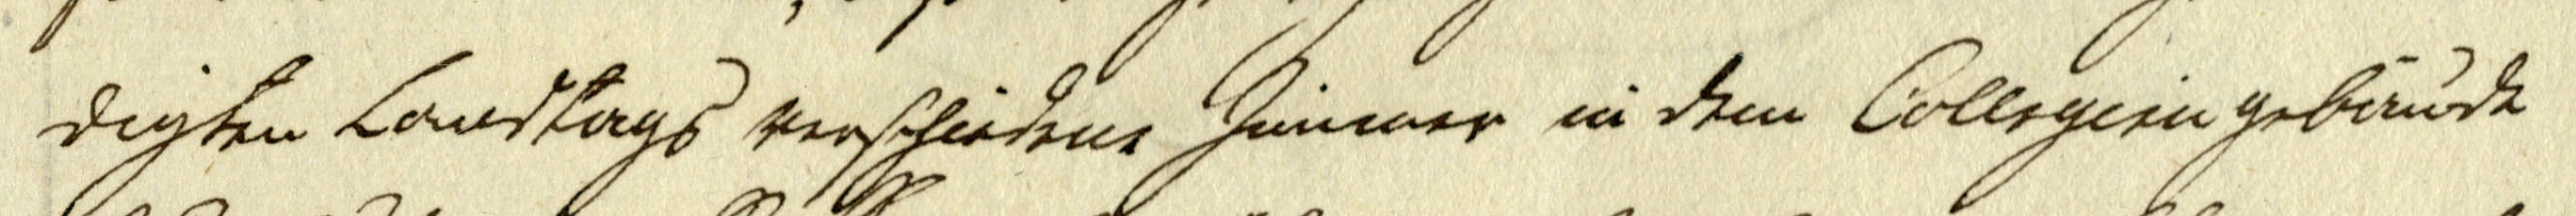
digten Landtags verschiedene Zimmer in dem Collegiengebäude
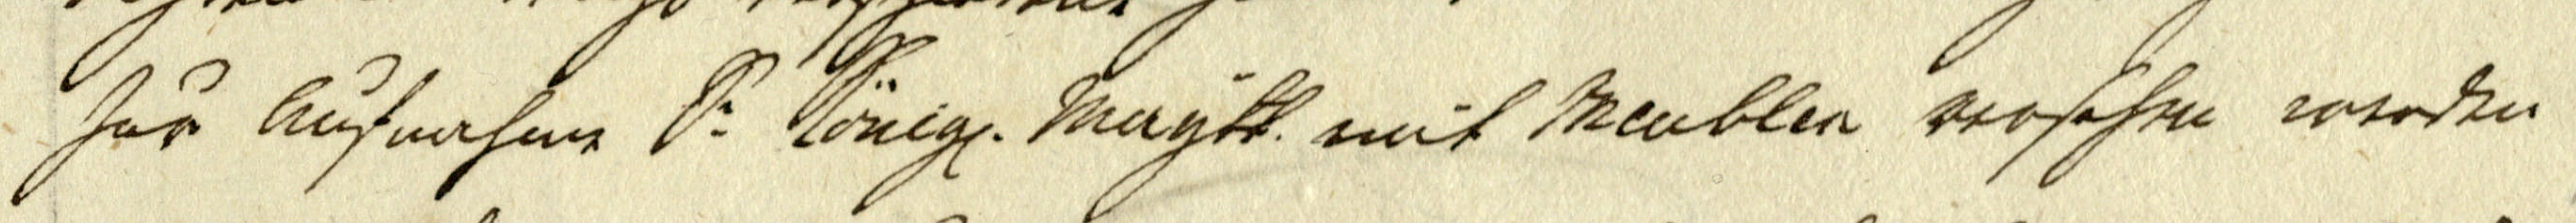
zur Aufnahme Sr. Königl. Maÿtt. mit Meublen versehen werden
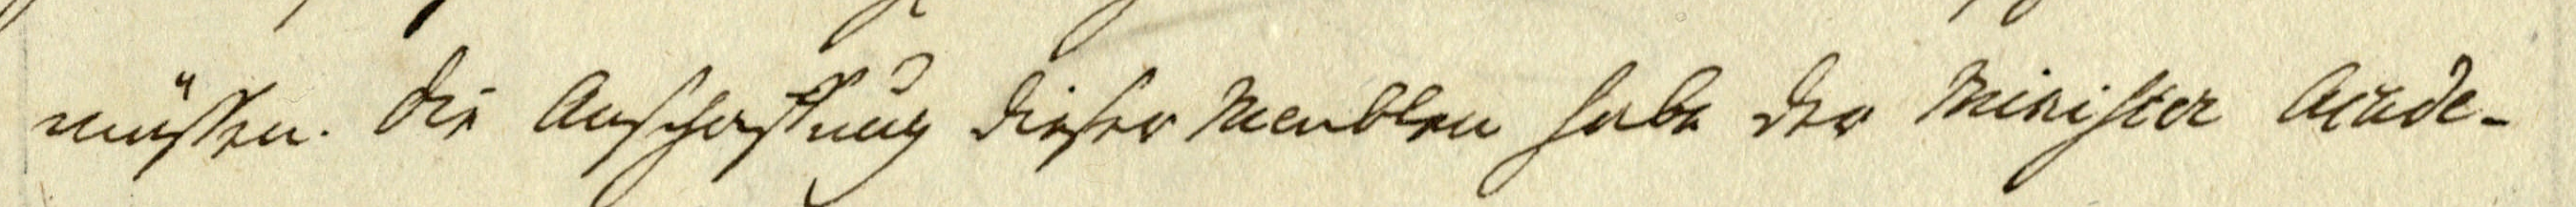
müssen. Die Anschaffung dieser Meublen habe der Minister Acade¬
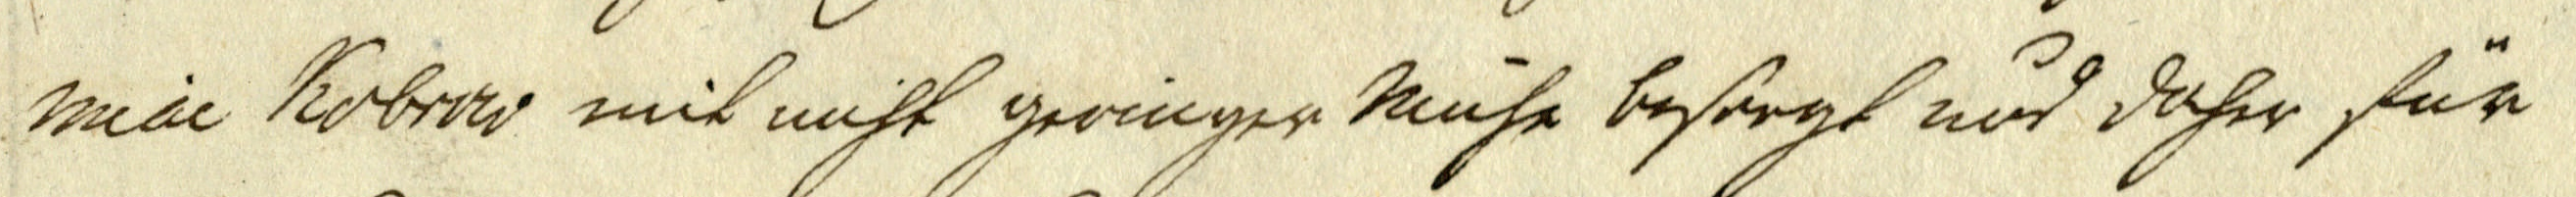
miae Kobrow mit nicht geringer Mühe besorgt und daher für
